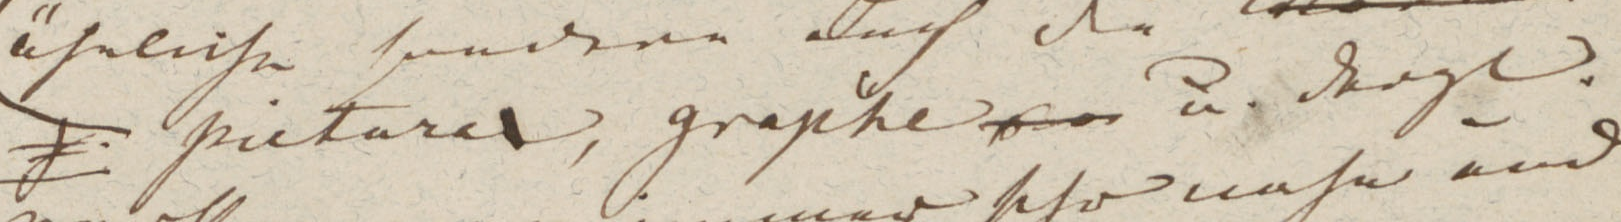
%% picturae, graphe u. dergl.
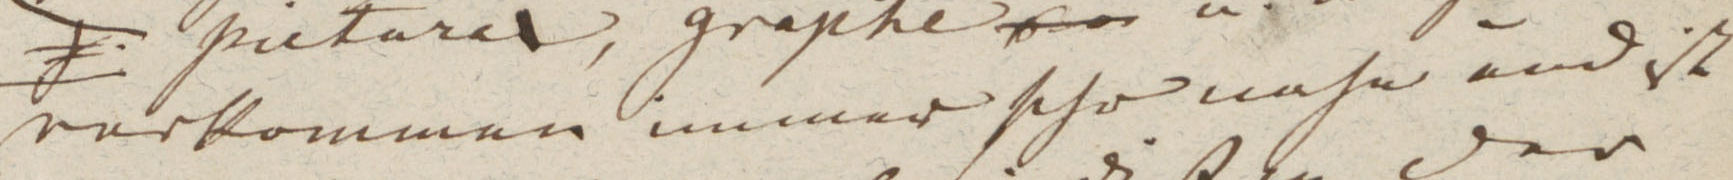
vorkommen immer sehr nahe und ist
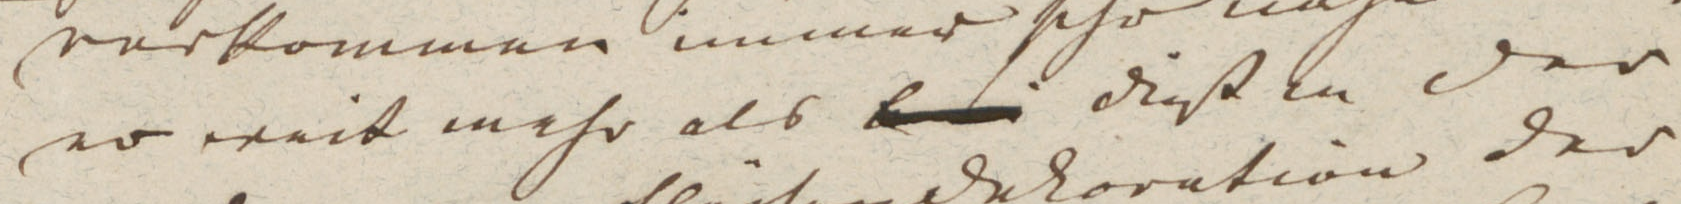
er weit mehr als bei diess in der
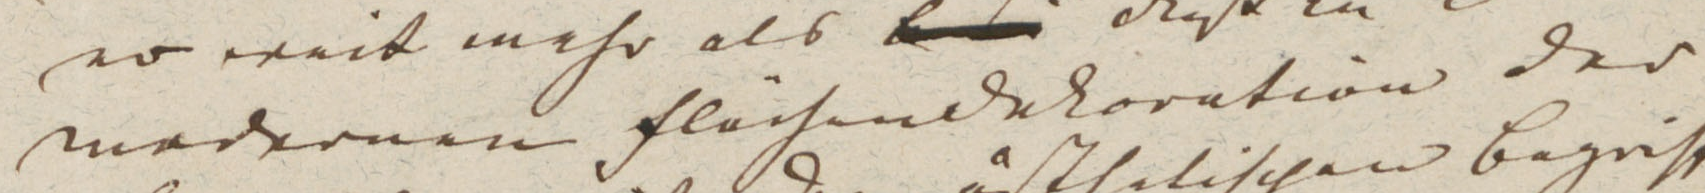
modernen Flächendekoration der
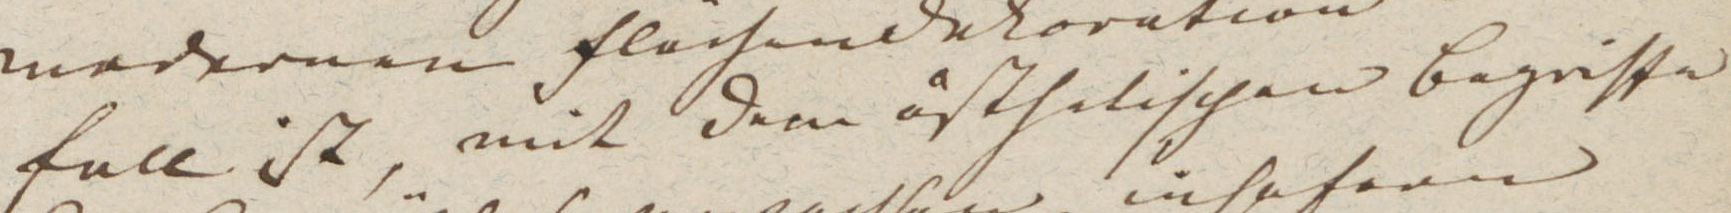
Fall ist, mit dem ästhetischen Begriffe
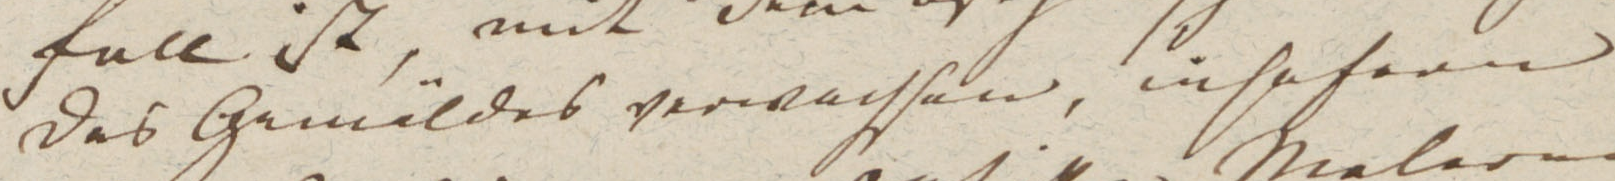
des Gemäldes verwachsen, insofern
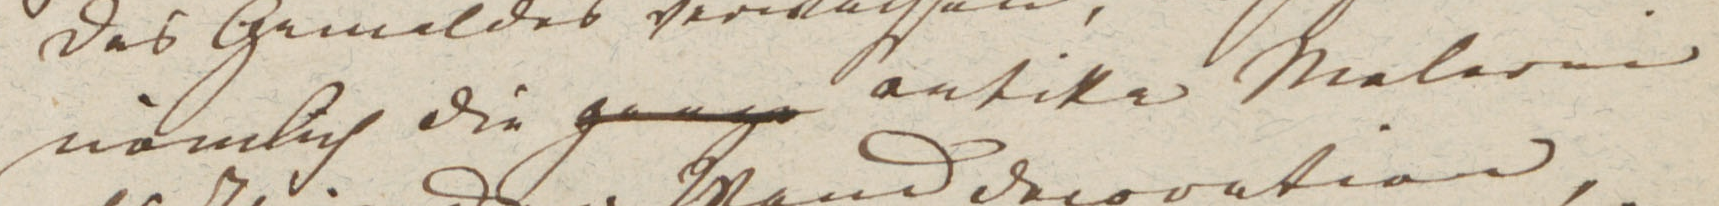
nämlich die ganze antike Malerei
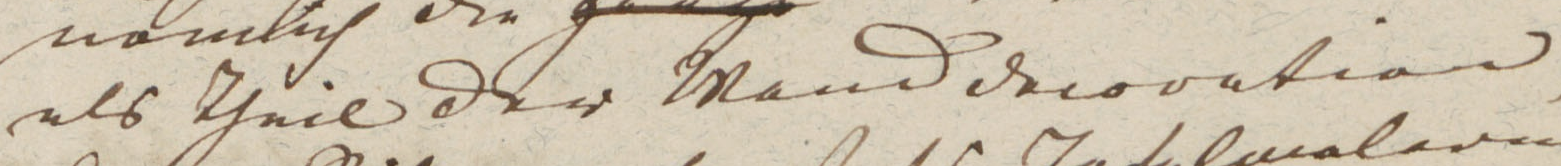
als Theil der decoration,
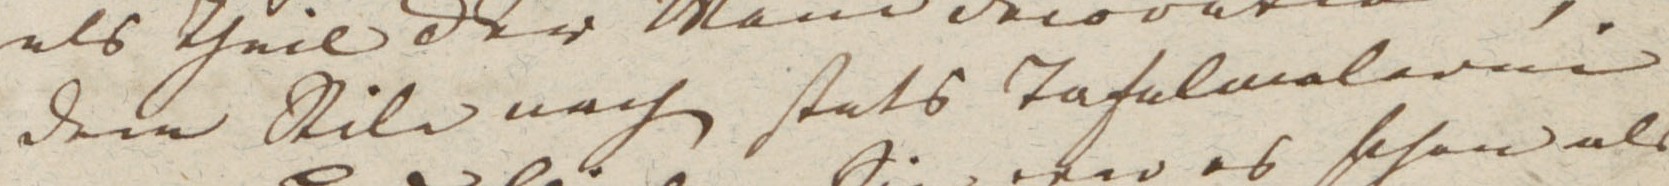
dem Stile nach stets Tafelmalerei
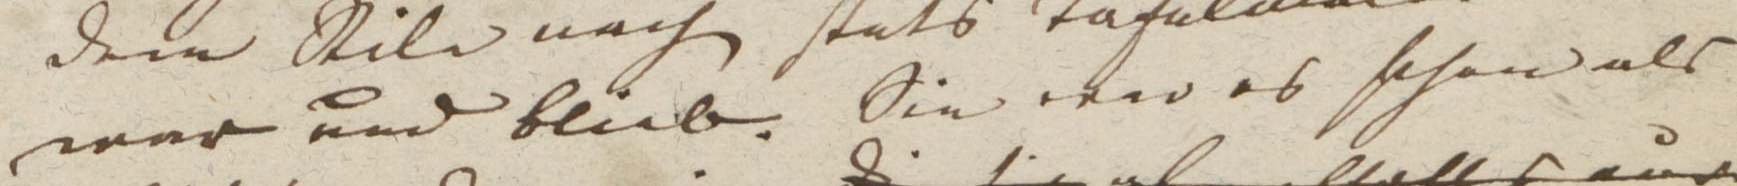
war und blieb. Sie war es schon als
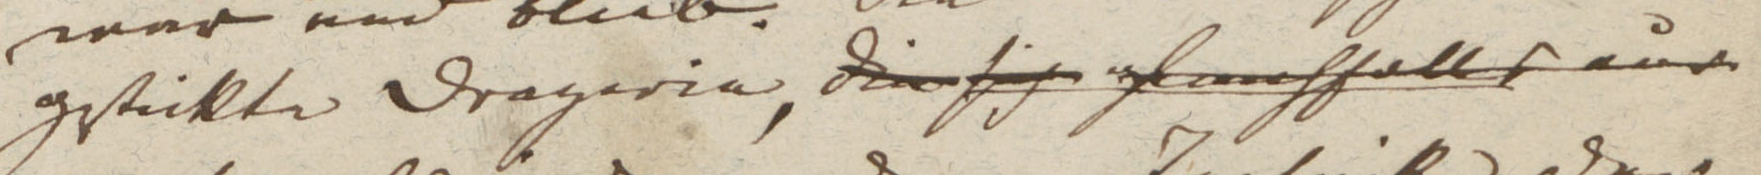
gestickte Draperie, die sich gleichfalls aus
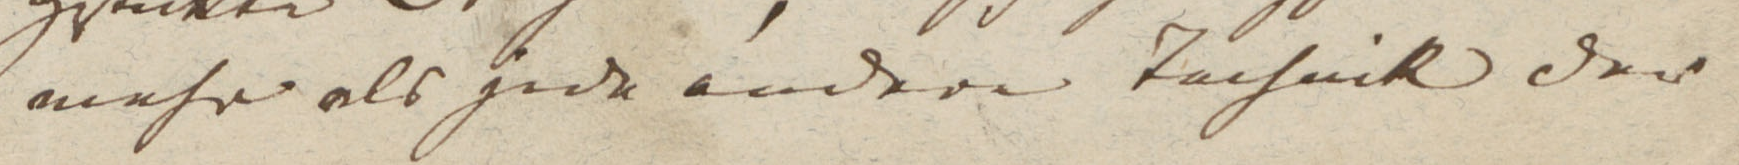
mehr als jede andere Technik der
